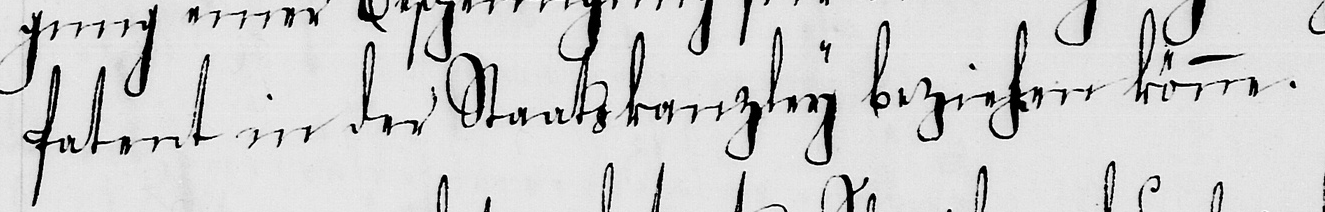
Patent in der Staatskanzley beziehen könne.
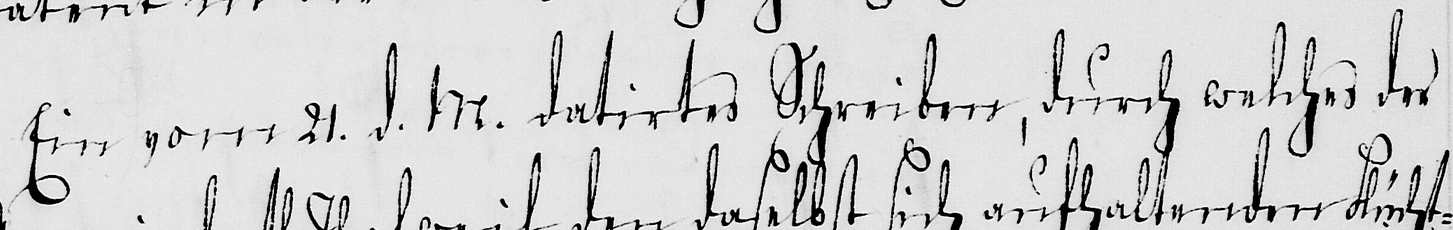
Ein vom 21. d. M. datirtes Schreiben, durch welches der
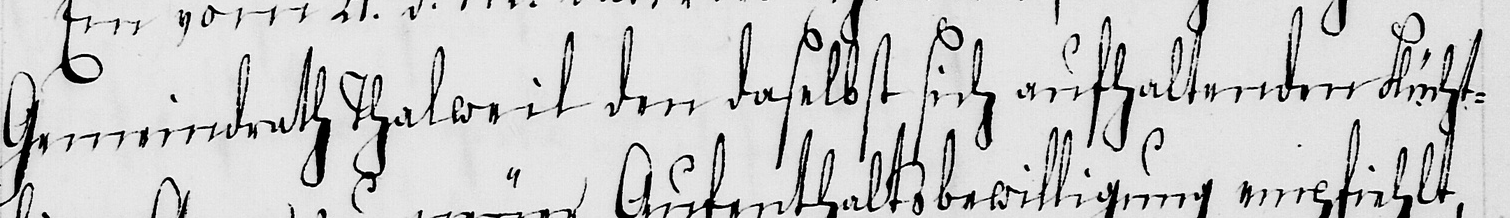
Gemeindrath Thalweil den daselbst sich aufhaltenden Flücht¬
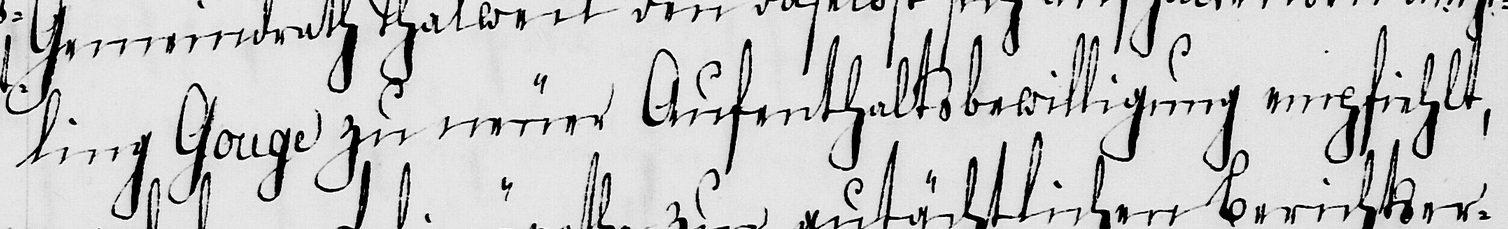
ling Gouge zu neuer Aufenthaltsbewilligung empfiehlt,
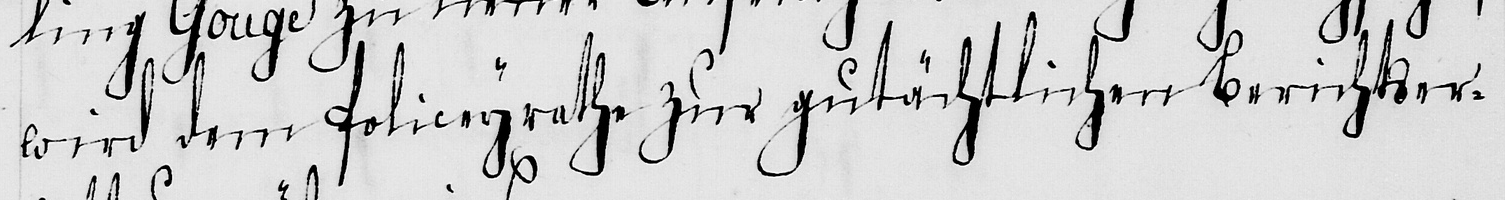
wird dem Policeyrathe zur gutächtlichen Berichtser¬
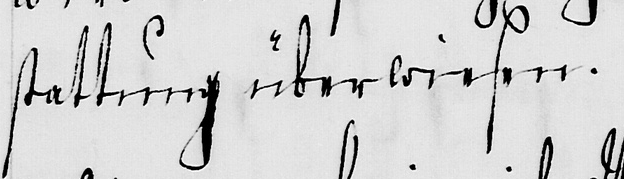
stattung überwiesen.
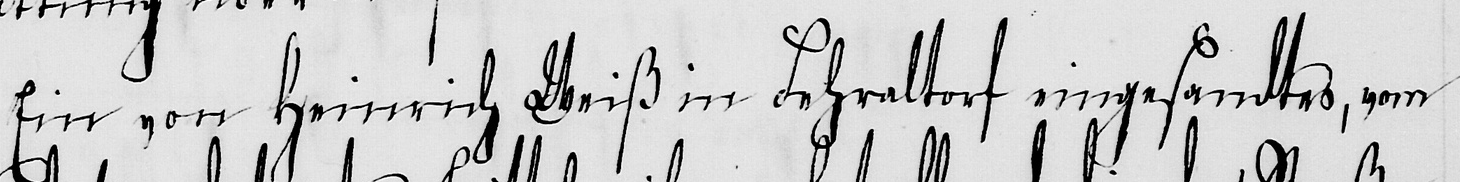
Ein von Heinrich Weiß in Fehraltorf eingesandtes, vom
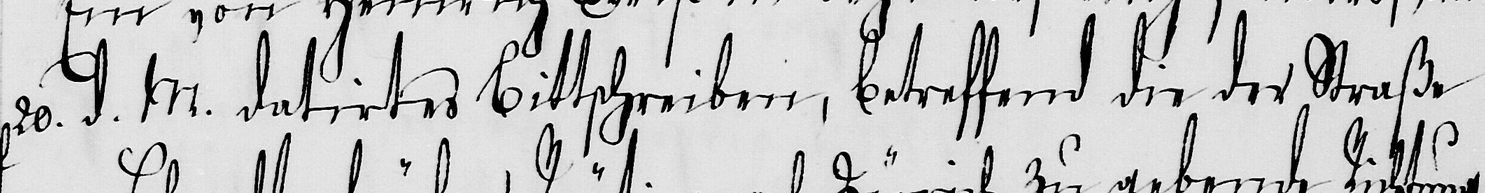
d. M. datirtes Bittschreiben, betreffend die der Straße
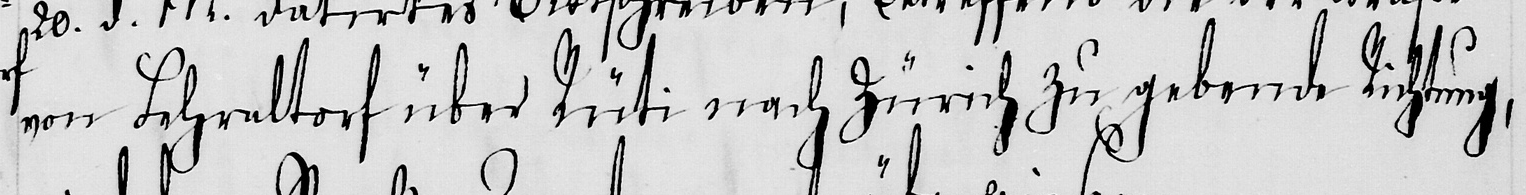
von Fehraltorf über Rüti nach Zürich zu gebende Richtung,
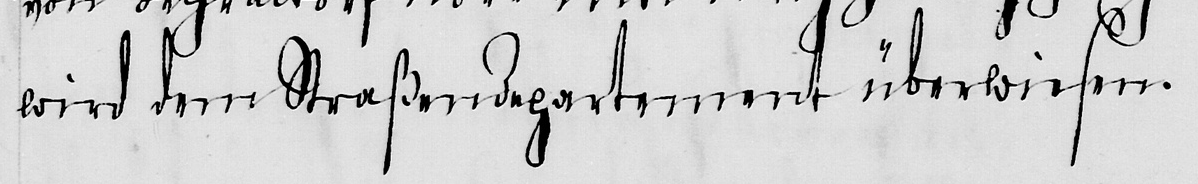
wird dem Straßendepartement überwiesen.
